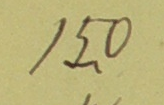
150
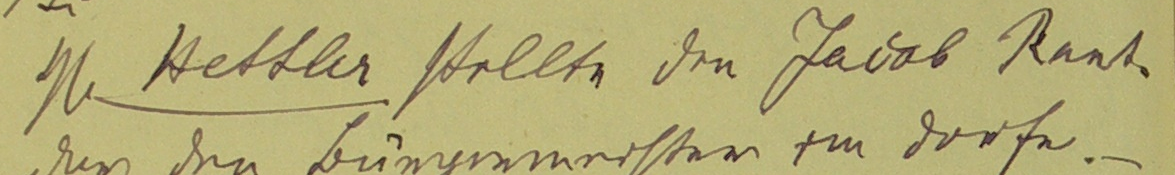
Herr Hettler stellte den Jakob Ranther
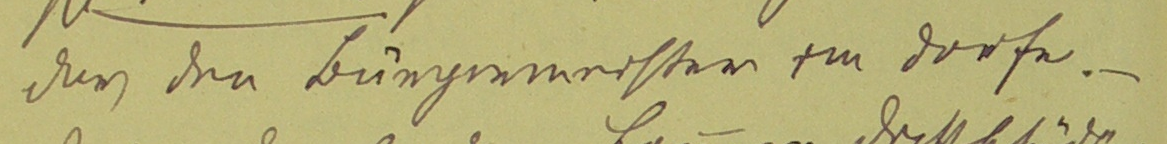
dar, der Bürgermeister vom Dorfe.-
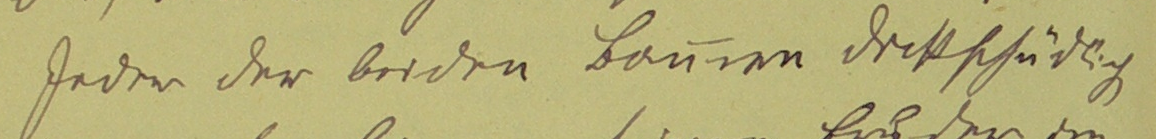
Jeder der beiden Bauern dickschädlich,
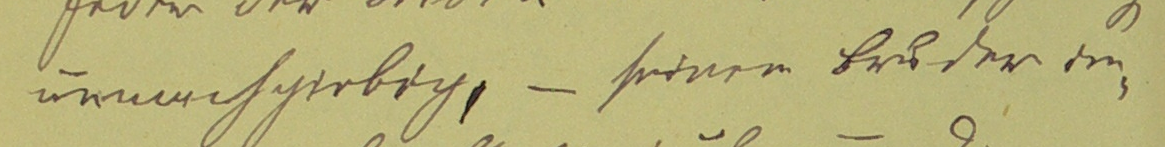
unnachgiebig,- seinem Bruder
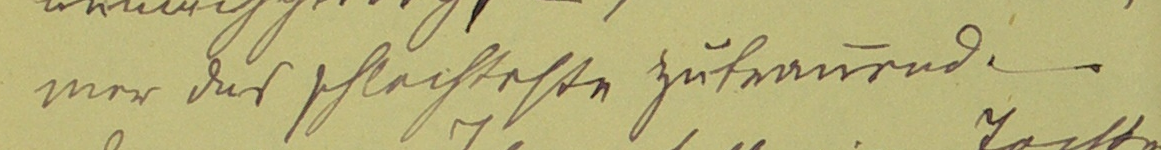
das schlechteste zutrauend,-
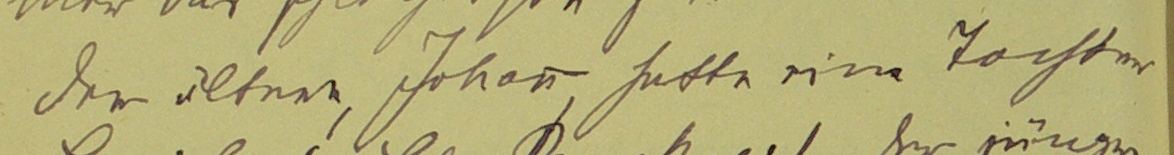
der ältere Johann, hatte eine Tochter
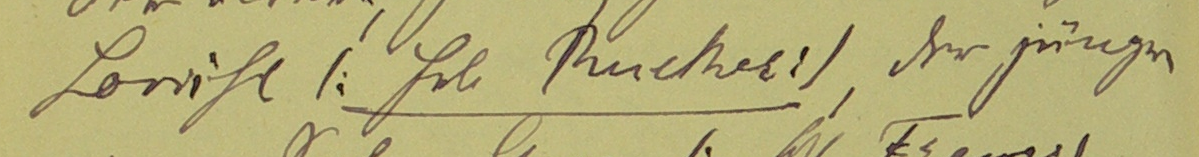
Louise ( : Frl. Rucker: ), der jüngere
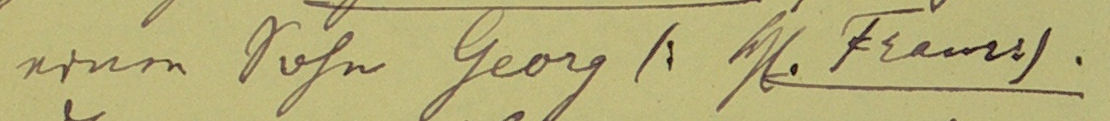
einen Sohn Georg (:H. Franz:) .
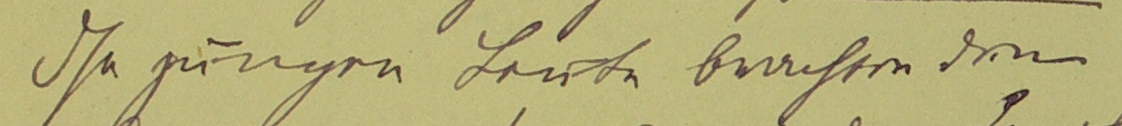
Diese jungen Leute brachten den
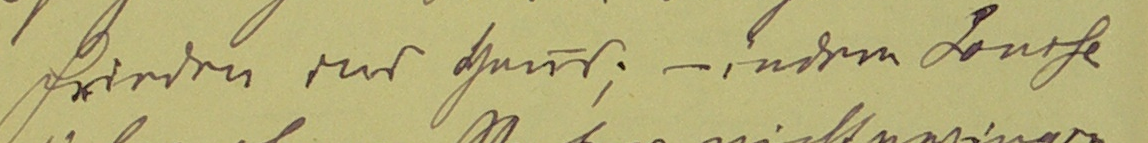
Frieden ins Haus:-indem Luoise
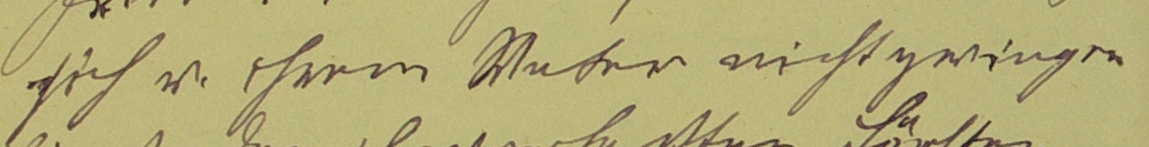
sich von ihrem Vater nicht zwingen
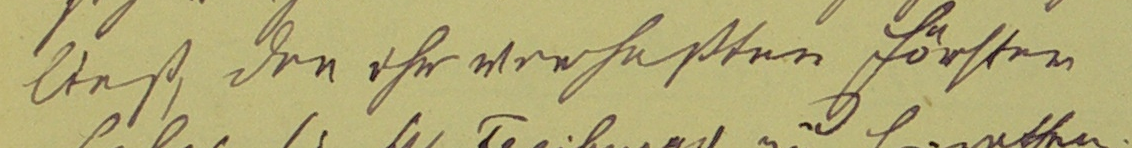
ließ, den ihr verhaßten Förster
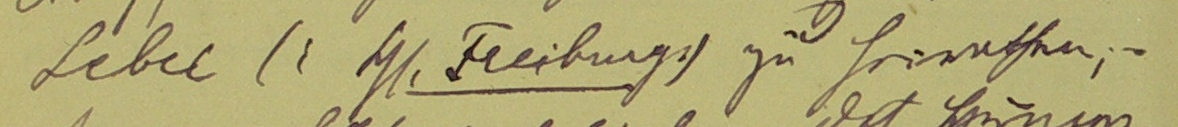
Lebec (:H. Freiburg : ) zu heiraten.
